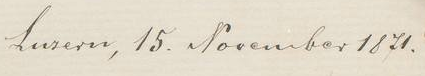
Luzern, 15. November 1871.
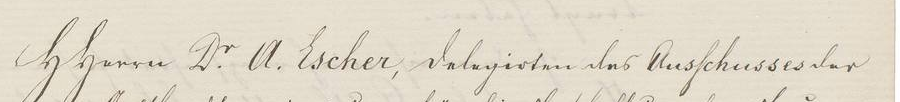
HHerrn Dr A. Escher, Delegirten des Ausschusses der
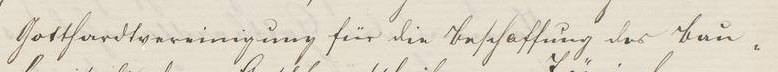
Gotthardtvereinigung für die Beschaffung des Bau-
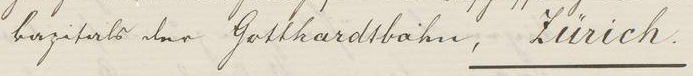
kapitals der Gotthardtbahn, Zürich.
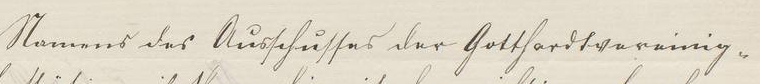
Namens des Ausschusses der Gotthardtvereinig-
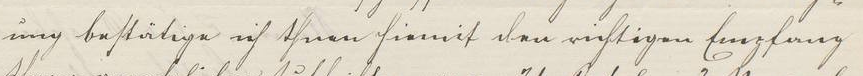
ung bestätige ich Ihnen hiemit den richtigen Empfang
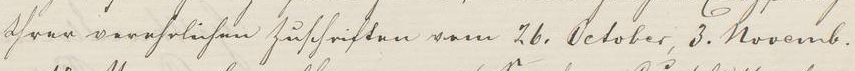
Ihrer verehrlichen Zuschriften vom 26. October, 3. Novemb.
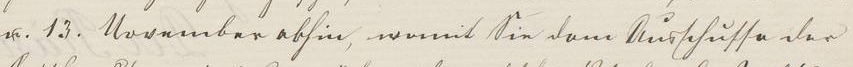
&. 13. November abhin, womit Sie dem Ausschusse der
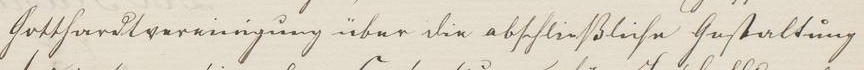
Gotthardtvereinigung über die abschließliche Gestaltung
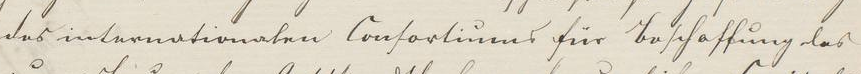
des internationalen Consortiums für Beschaffung des
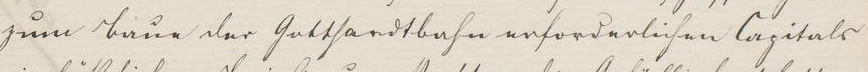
zum Bau der Gotthardtbahn erforderlichen Capitals
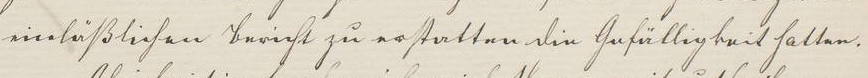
einläßlichen Bericht zu erstatten die Gefälligkeit hatten.
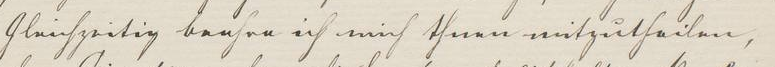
Gleichzeitig beehre ich mich Ihnen mitzutheilen,
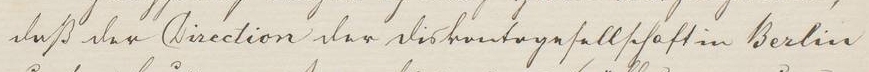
daß der Direction der Diskontogesellschaft in Berlin
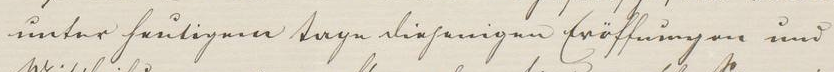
unter heutigem Tage diejenigen Eröffnungen und
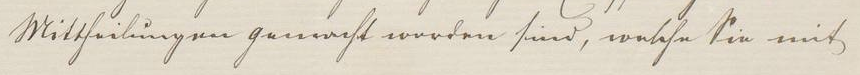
Mittheilungen gemacht worden sind, welche Sie mit
